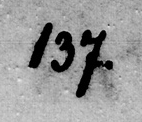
1837.,
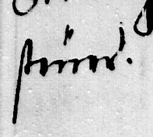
steuer
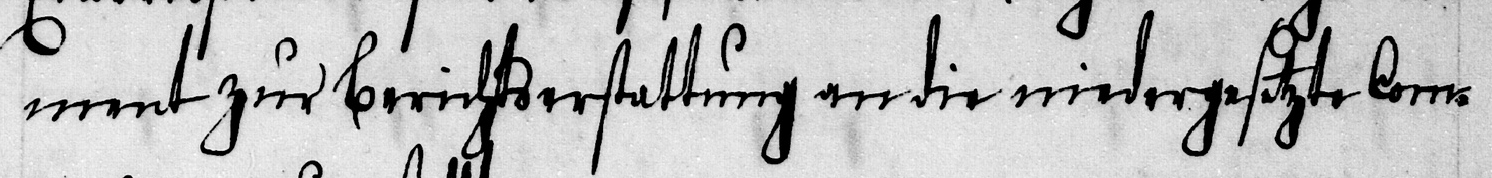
ment zur Berichtserstattung an die niedergesetzte Com¬
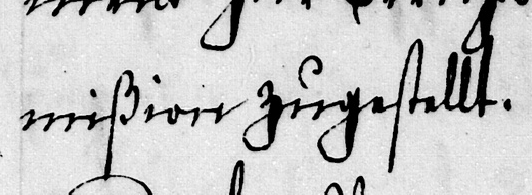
mißion zugestellt.
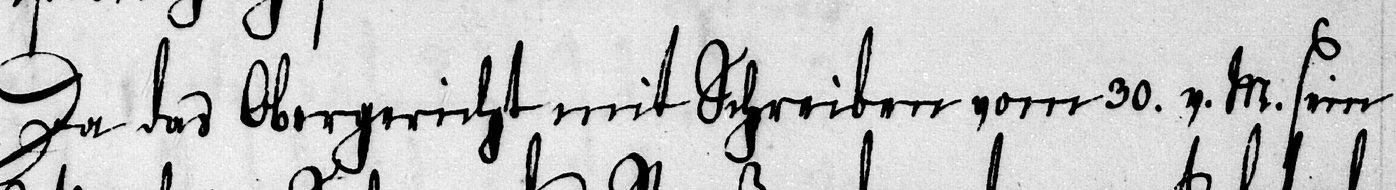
Da das Obergericht mit Schreiben vom 30. v. M. sein
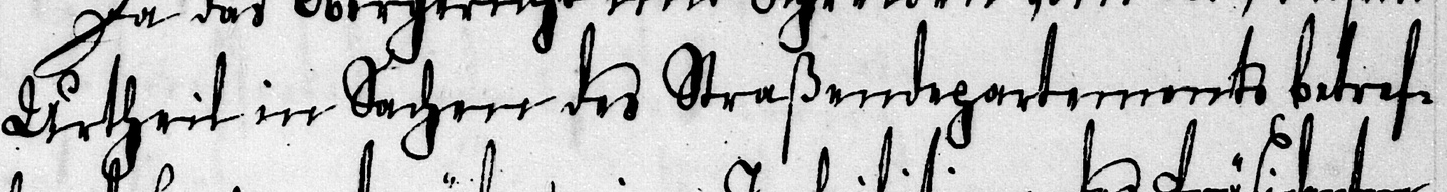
Urtheil in Sachen des Straßendepartements betref¬
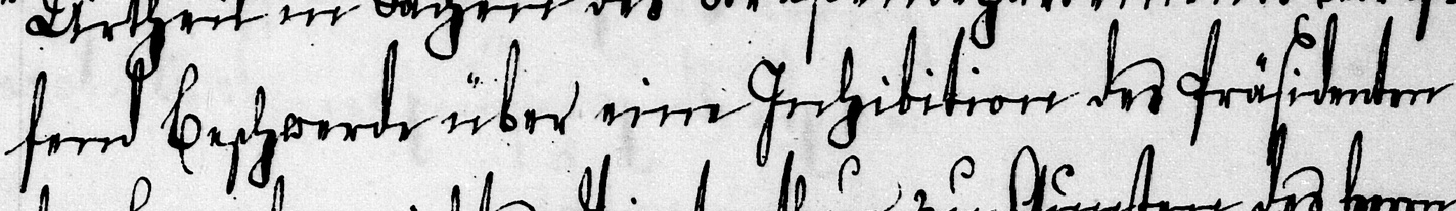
fend Beschwerde über eine Inhibition des Präsidenten
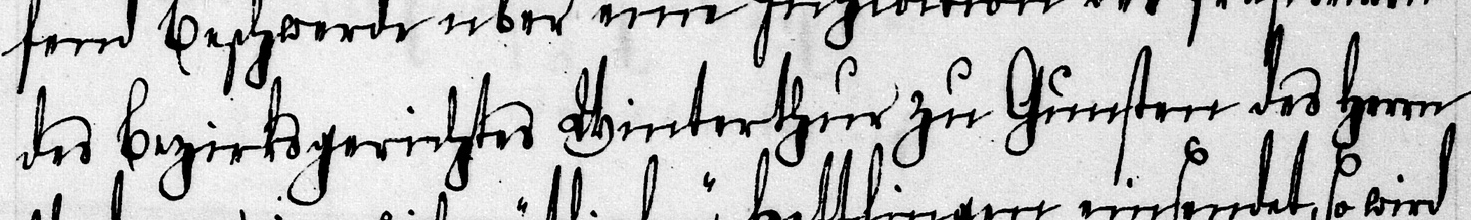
des Bezirksgerichtes Winterthur zu Gunsten des Herrn
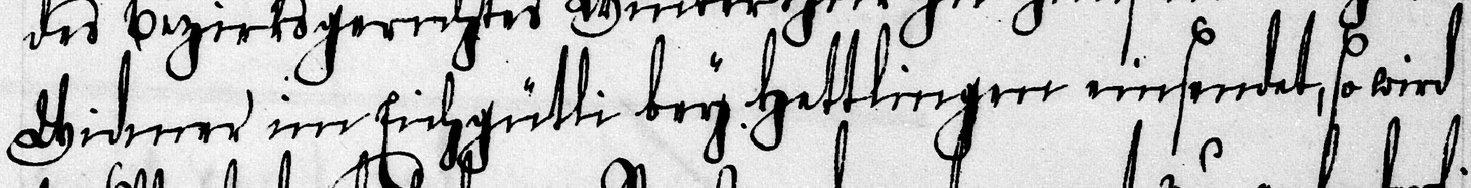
Widmer im Eichgütli bey Hettlingen einsendet, so wird
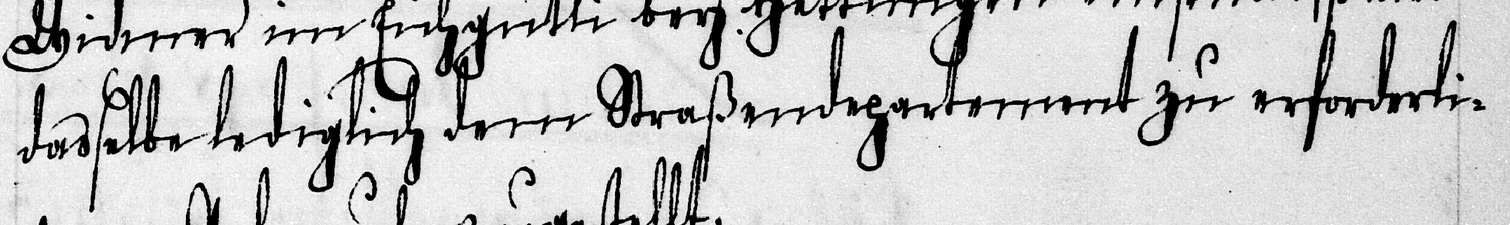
dasselbe lediglich dem Straßendepartement zu erforderli¬
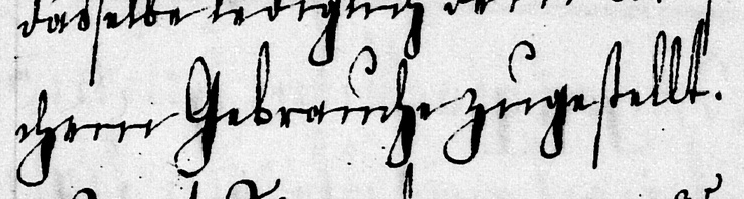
chem Gebrauche zugestellt.
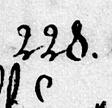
sten¬
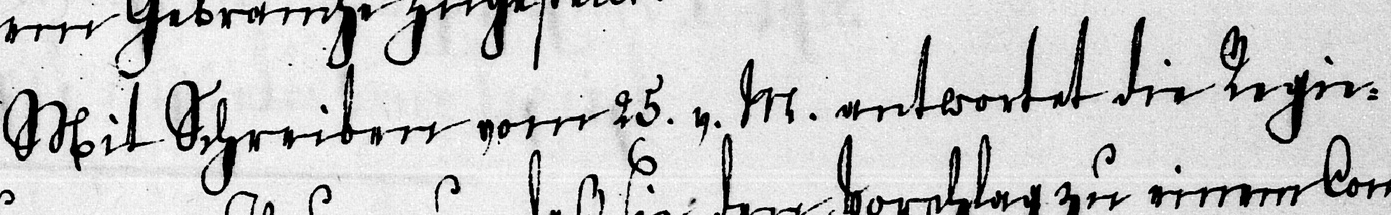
Mit Schreiben vom 25. v. M. antwortet die Regie¬
